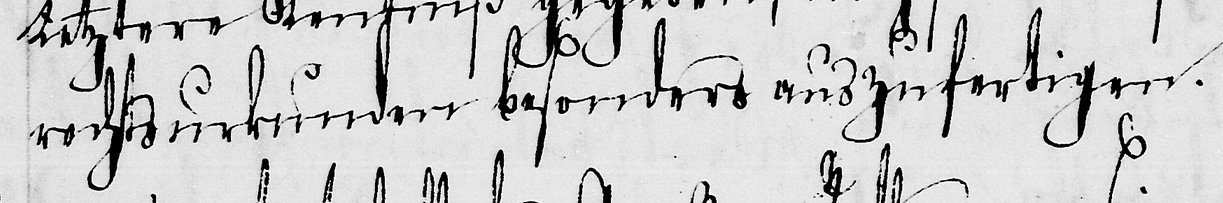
rechtsurkunden besonders auszufertigen.
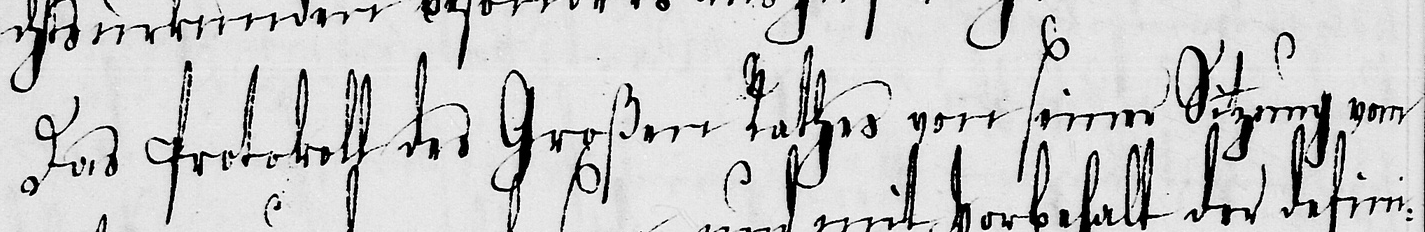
Das Protokoll des Großen Rathes von seiner Sitzung
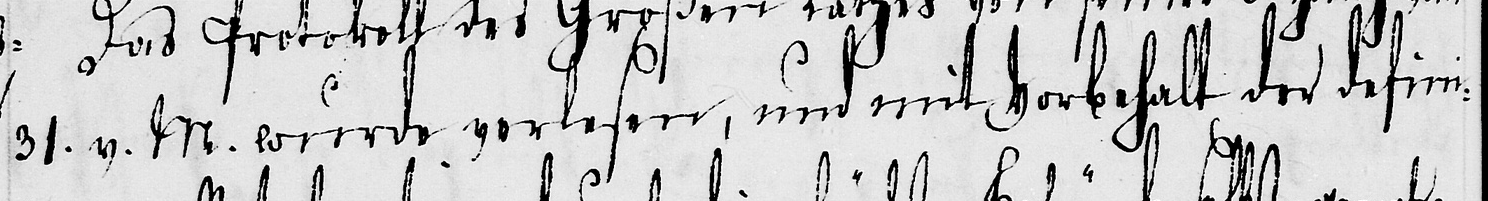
31. v. M. wurde verlesen, und mit Vorbehalt der defini¬
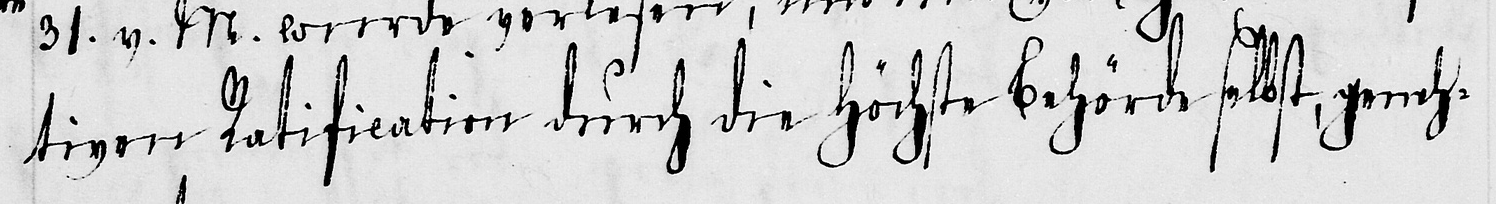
tiven Ratification durch die Höchste Behörde selbst, gen¬
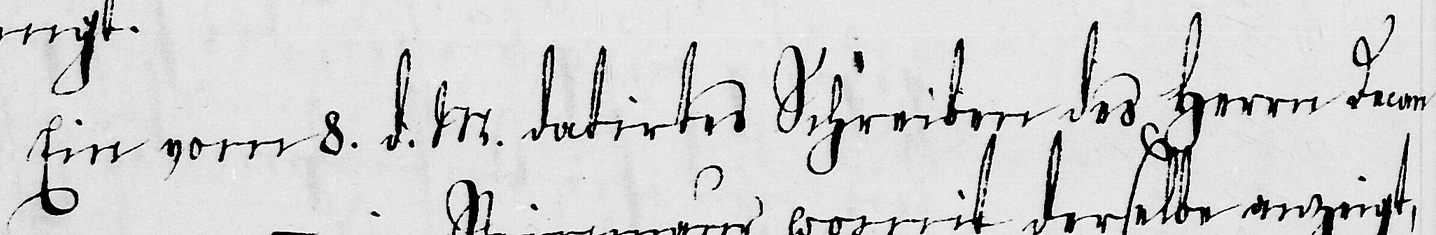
Ein vom 8. d. M. datirtes Schreiben des Herrn Dec¬
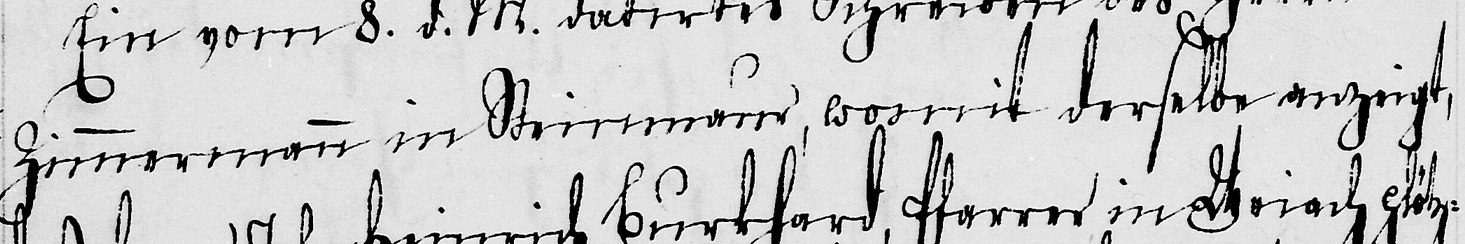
Zimmermann in Steinmaur, womit derselbe anzeigt,
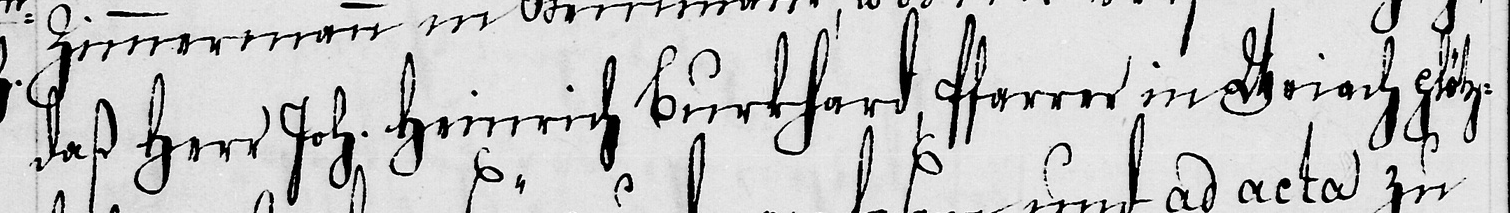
daß Herr Joh. Heinrich Burkhard, Pfarrer in Weiach plöt¬
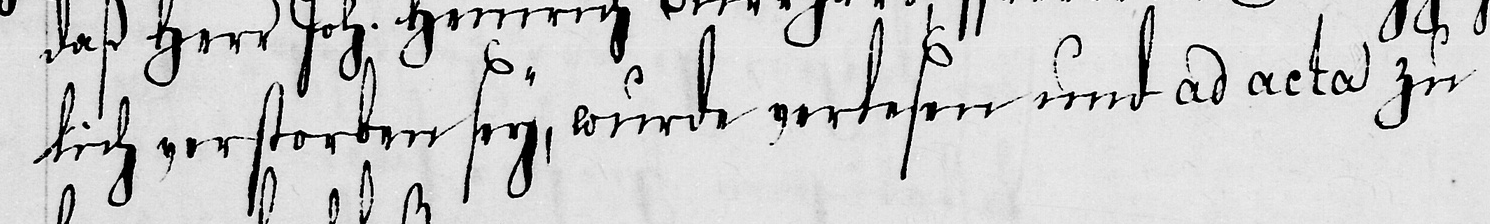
zlich verstorben sey, wurde verlesen und ad acta zu
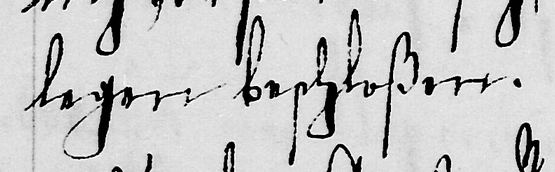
legen beschloßen.
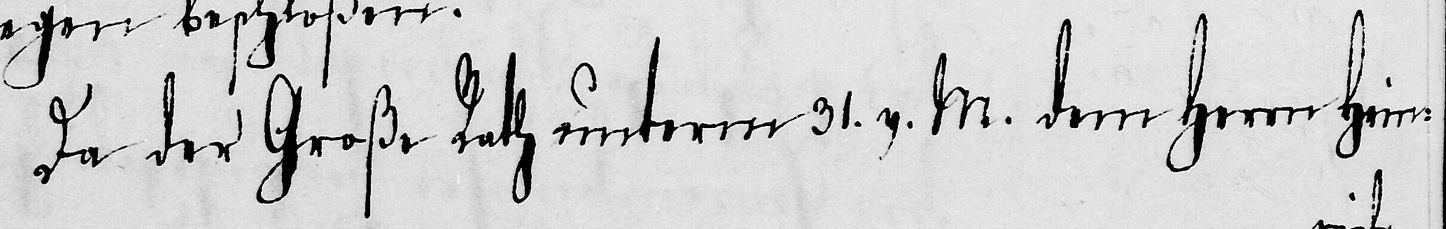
Da der Große Rath unterm 31. v. M. dem Herrn Hein-
